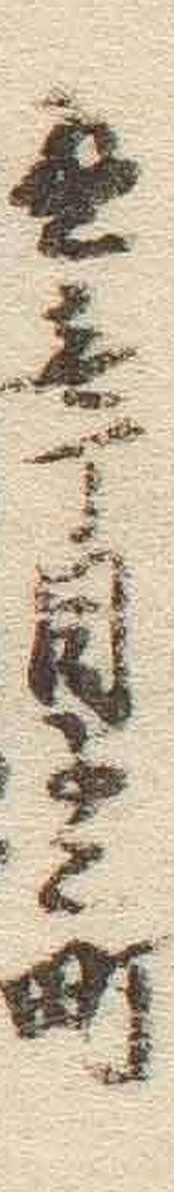通二丁目東よこ町
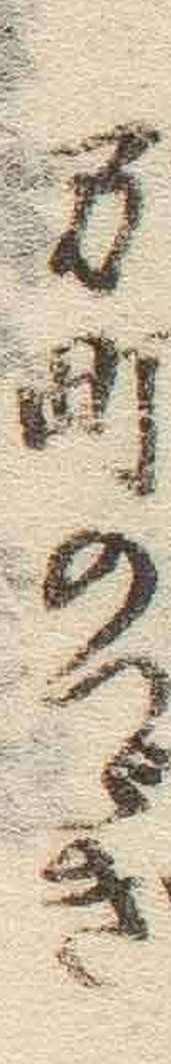万町のつゞき
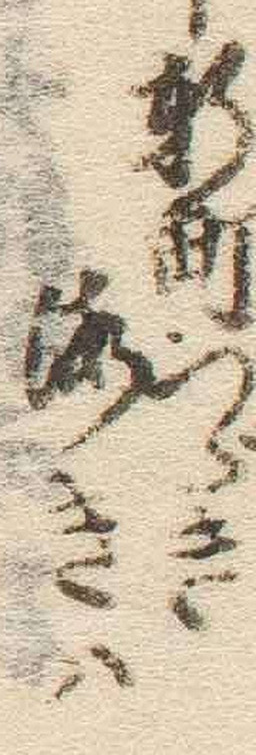海きは
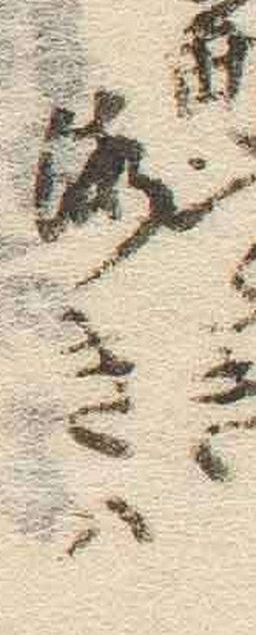海きは
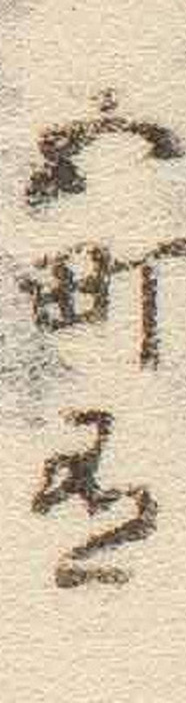五町有
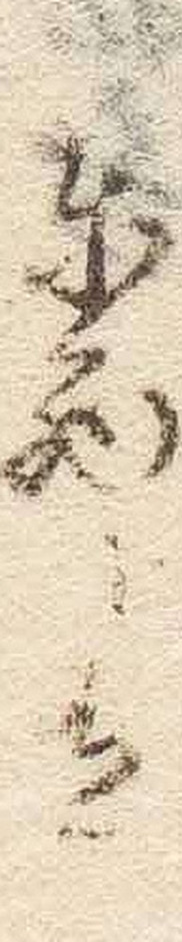東西ト有
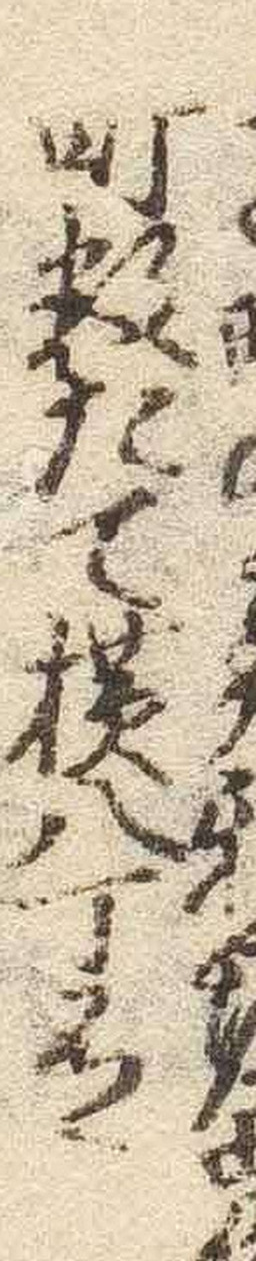町数たて横八丁有
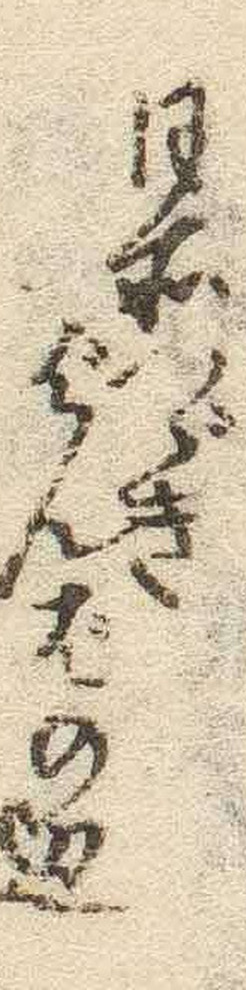ばんばの辺
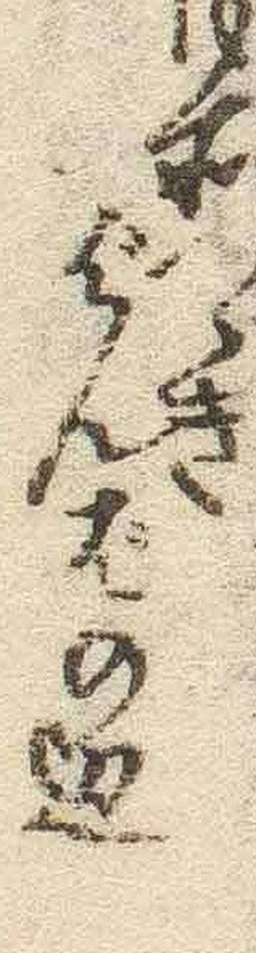ばんばの辺
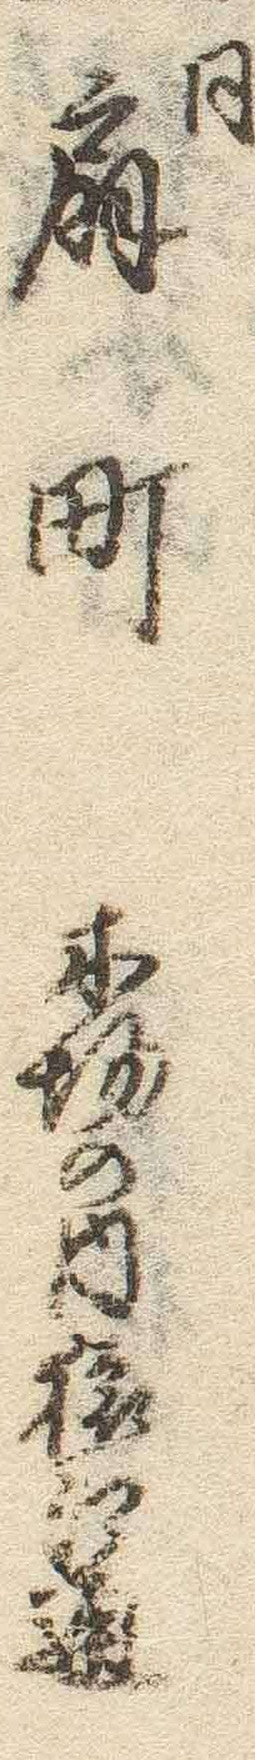扇町木場の内猿江通
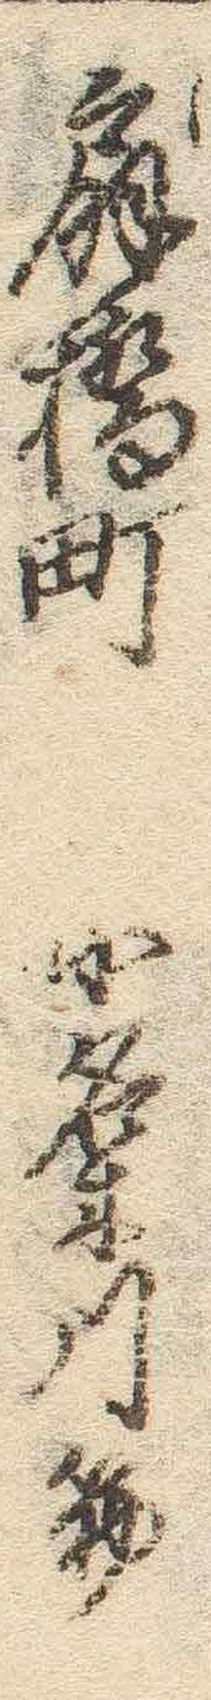扇橋町小名木川筋
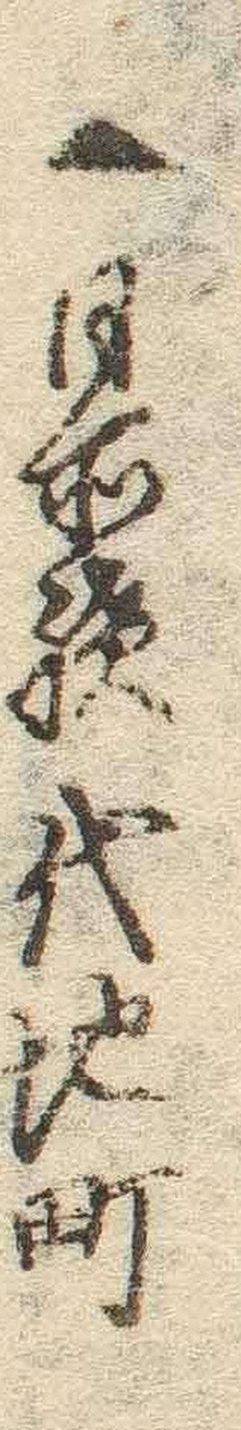▲同所続代地町
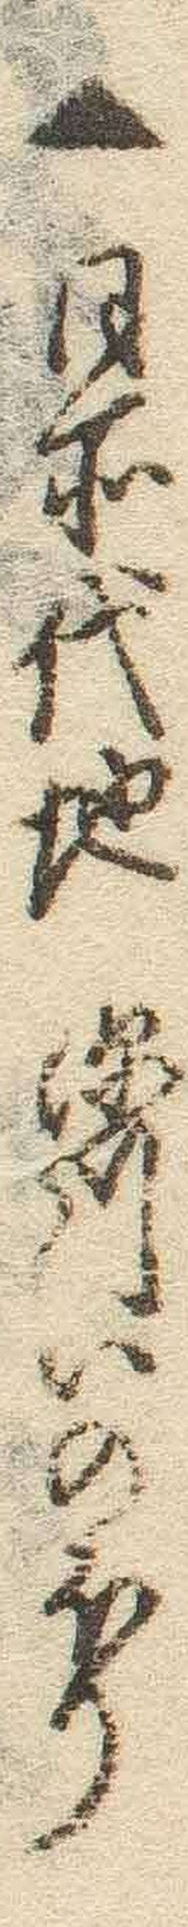▲同所代地深川いのほり
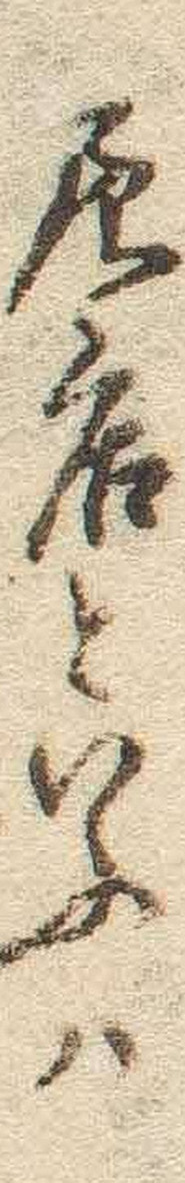尼店といふは
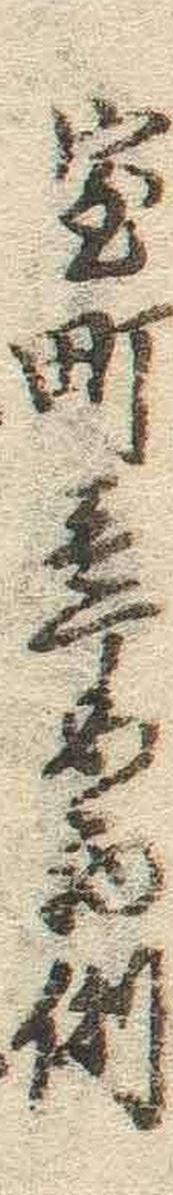室町壱丁め西側
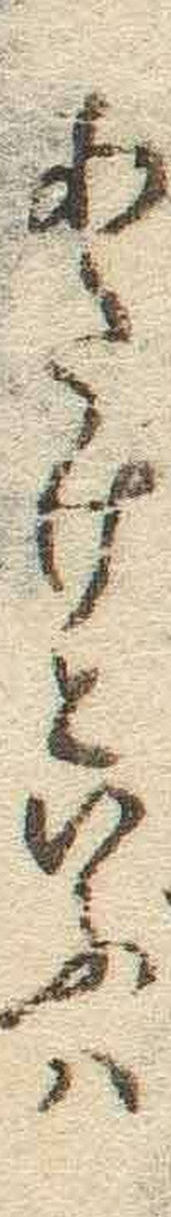あたけといふは
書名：江戸町独案内
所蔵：東京学芸大学附属図書館 国文学研究資料館
